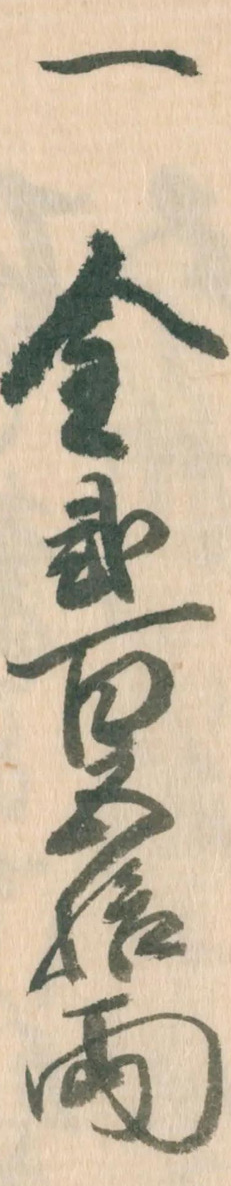一金弐百五拾両

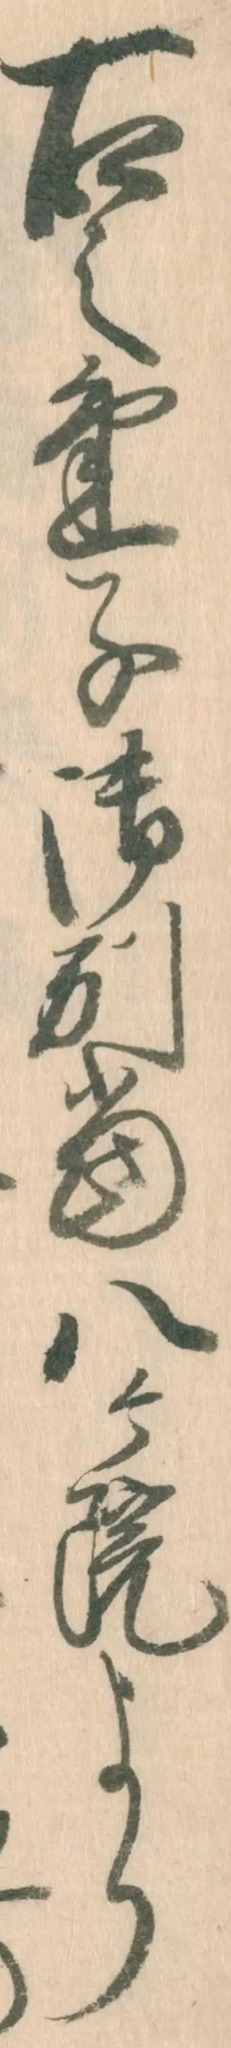右之金子御別当八ケ院より
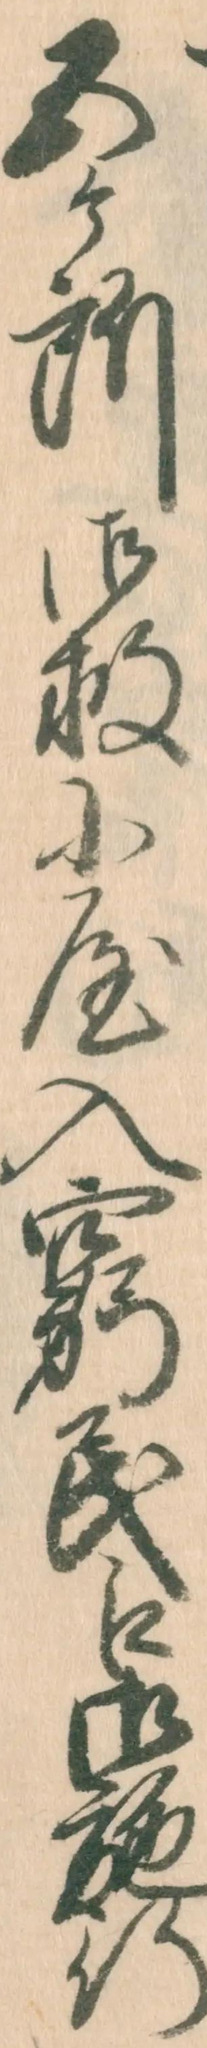五ケ所御救小屋入窮民え御施行
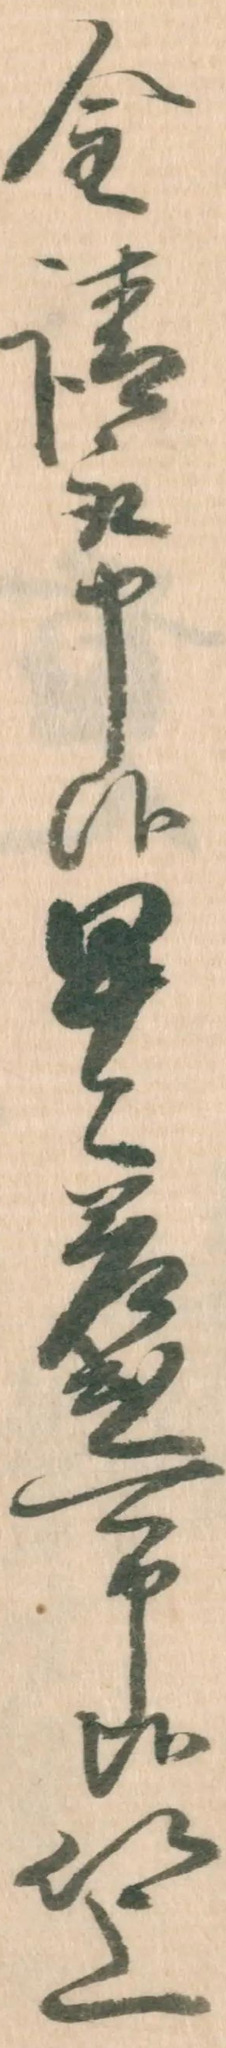金請取申候早〻差遣可申候以上
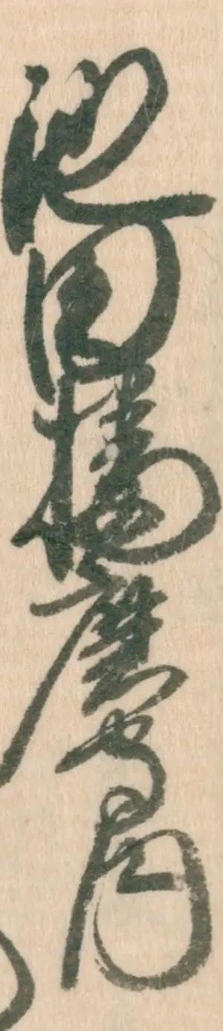池田播磨守内
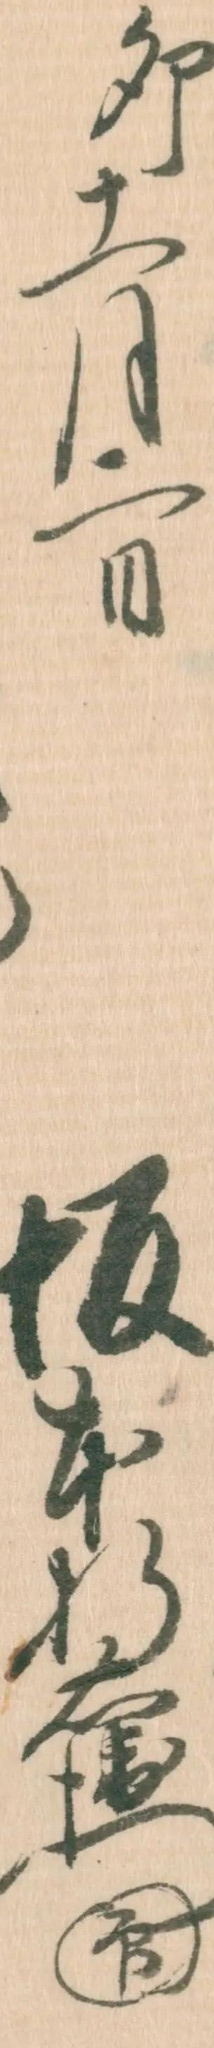卯十一月二日坂本折右衛門印
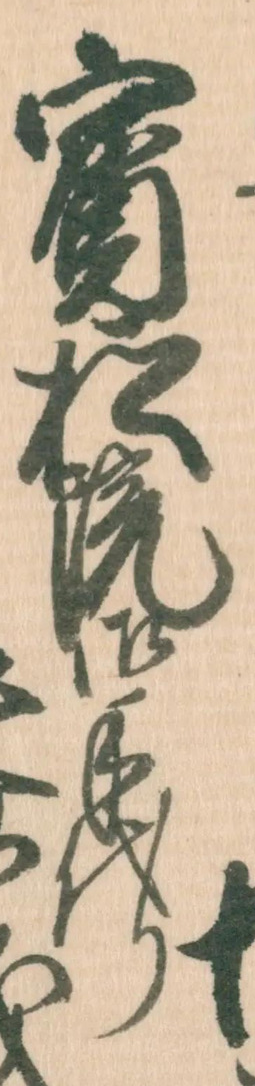宝松院御手代り
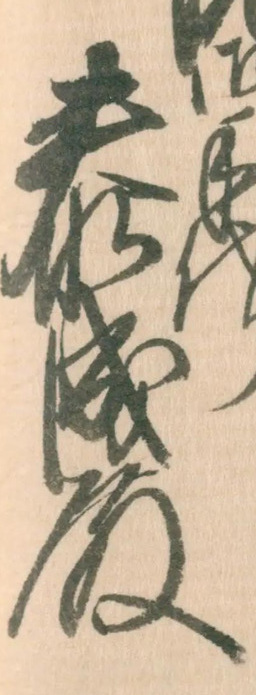泰成殿

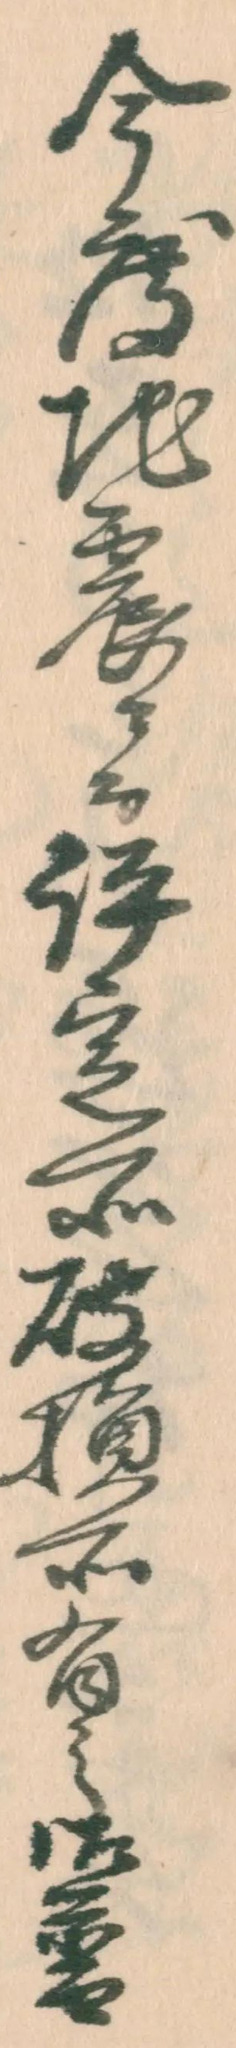今度地震ニて評定所破損ケ所有之御普
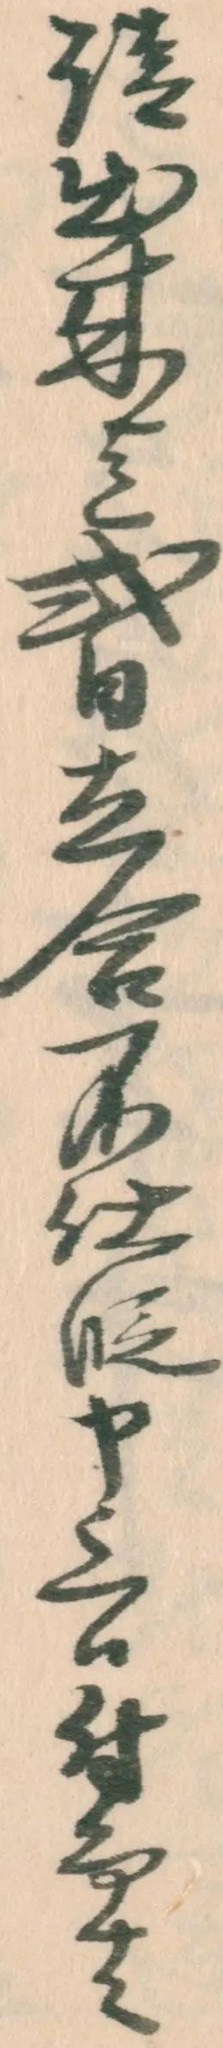請出来迄式日立合不仕段申上候付ては
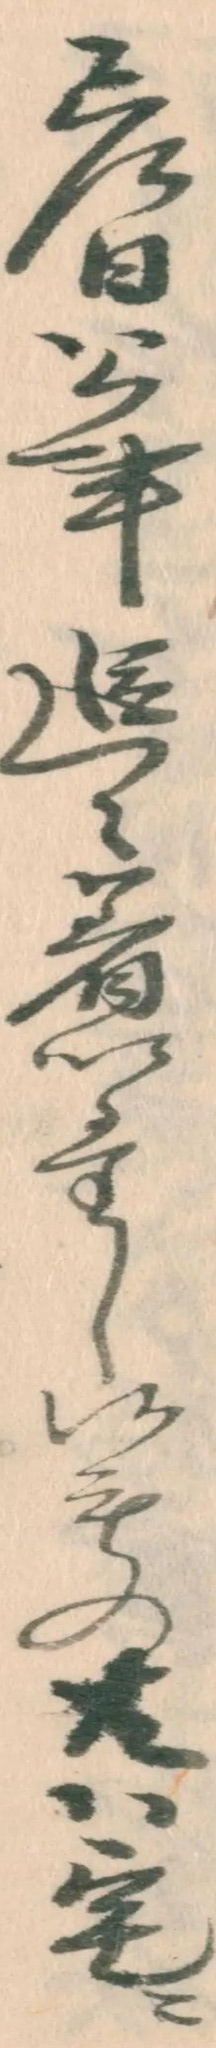差日公事追〻着いたし候もの共ハ宅ニ
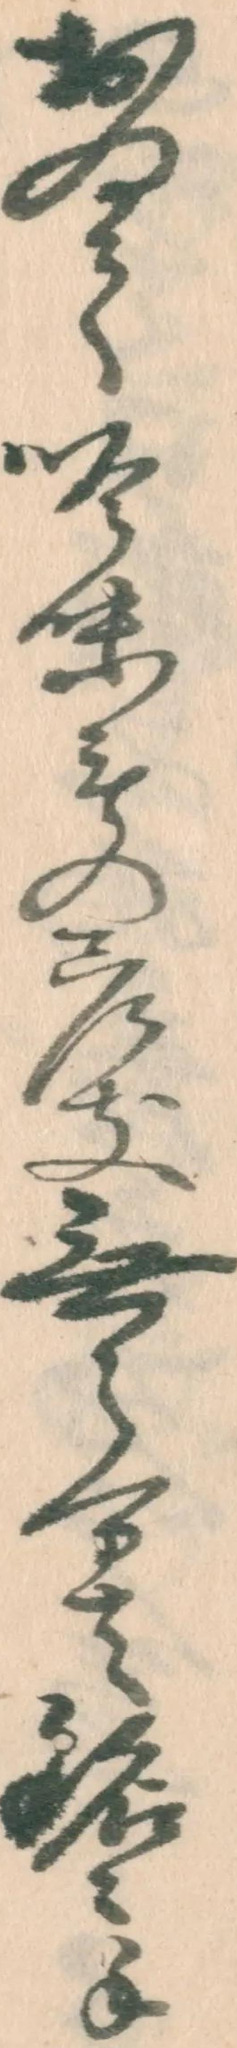おゐて吟味もの差支無之分は銘〻手
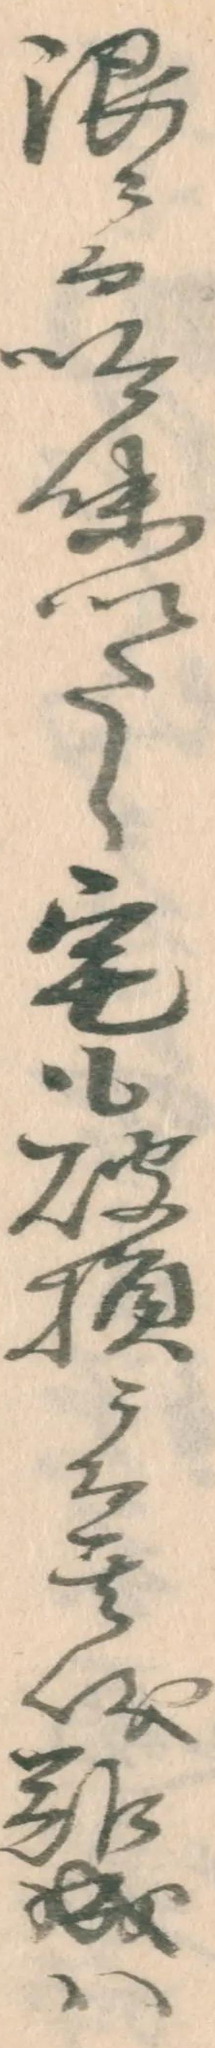限ニて吟味いたし宅も破損ニて其儀難成ハ
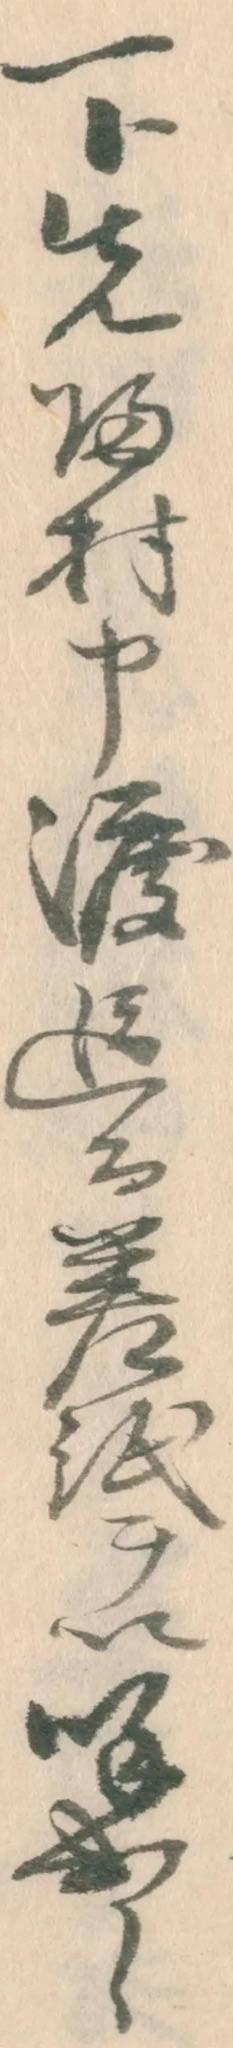一ト先帰村申渡追て差紙ヲ以呼出し
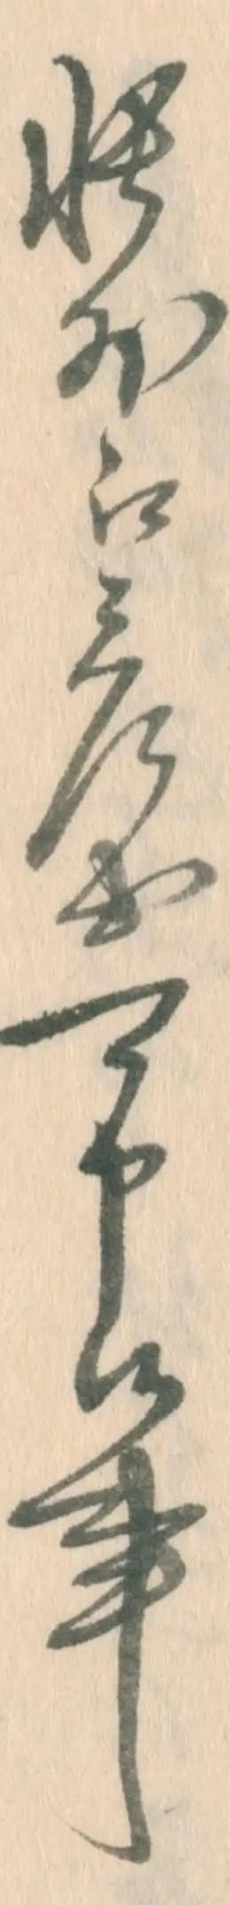帳外え差出可申候事

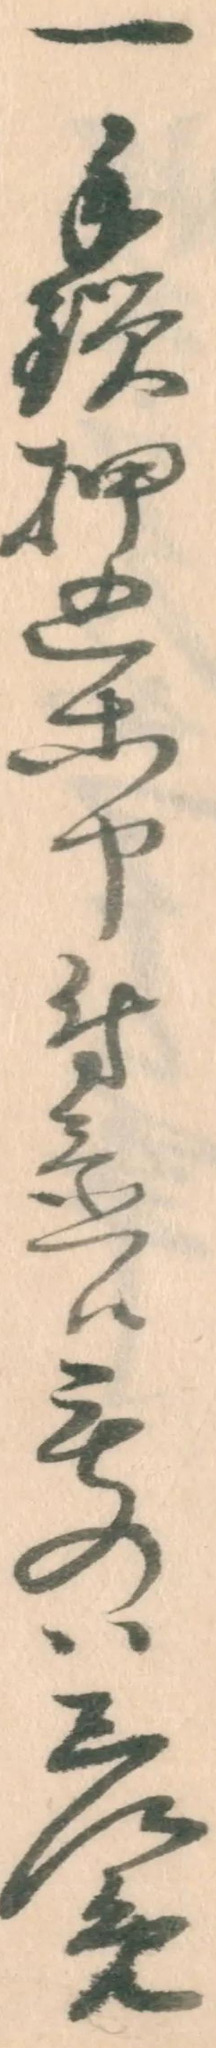一手鎖押込等申付置候ものハ差免
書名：地震災書留 2巻. [2] 内表紙に「地震一件　安政二卯年十月」とあり
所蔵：国立国会図書館 National Diet Library, JAPAN
